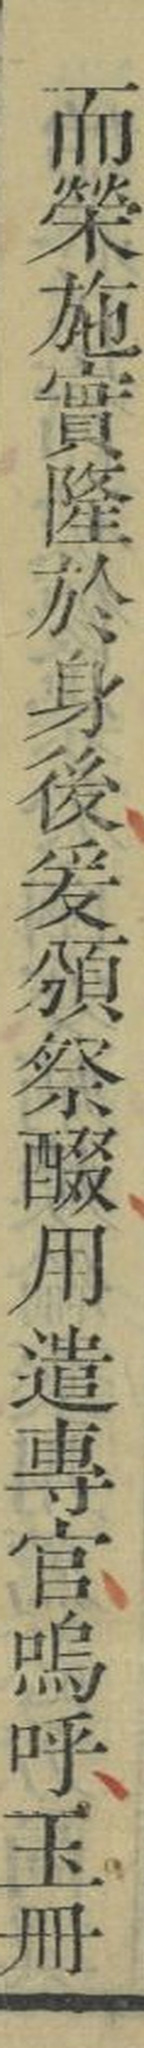而榮施實隆於身後爰頒祭醊用遣專官嗚呼玉冊
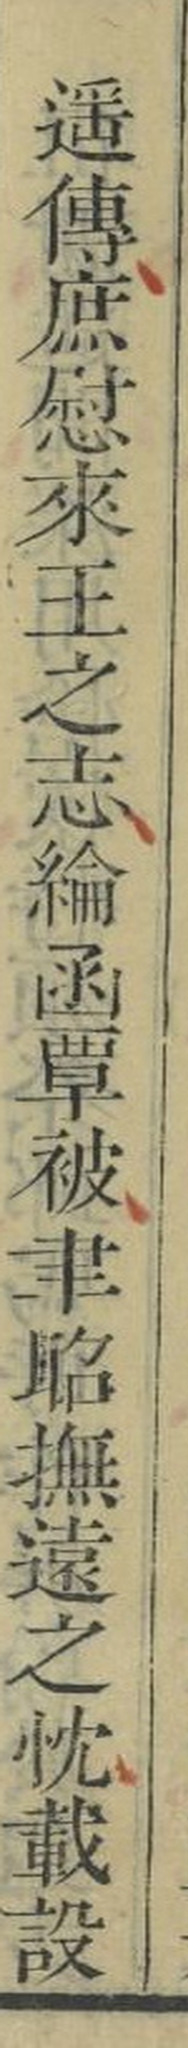遥傳庶慰來王之志綸函覃被聿昭撫遠之忱載設

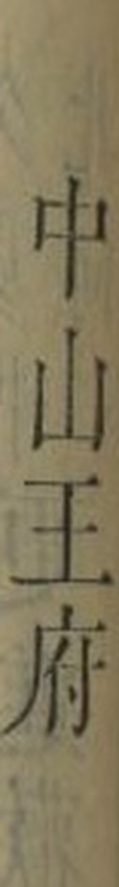中山王府
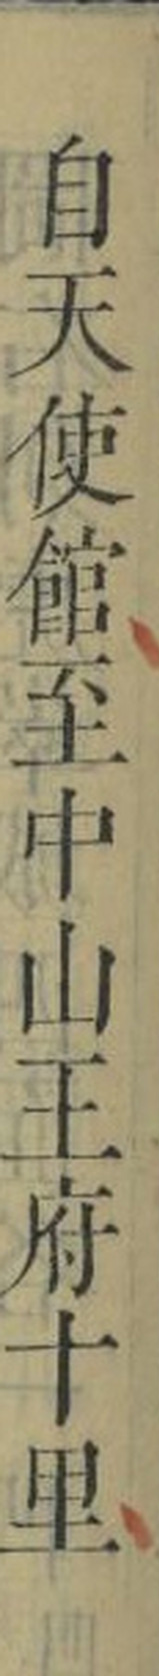自天使館至中山王府十里
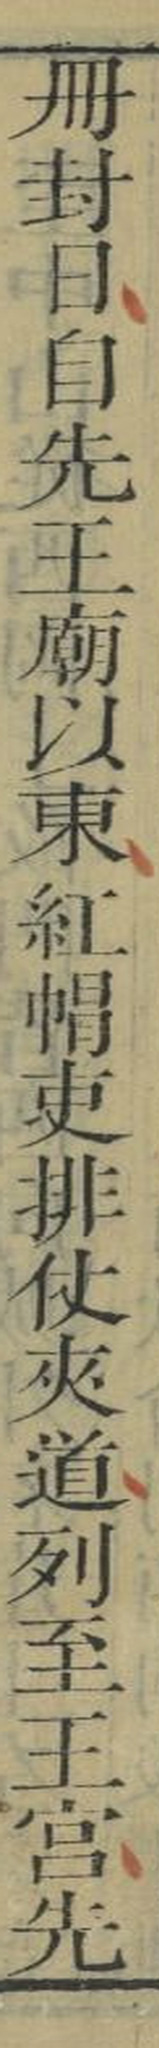冊封日自先王廟以東紅帽吏排仗夾道列至王宫先
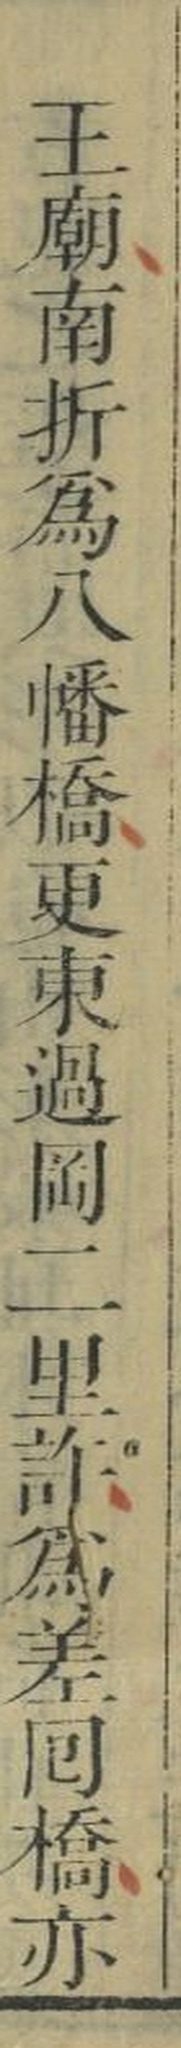王廟南折爲八幡橋更東過岡二里許爲差囘橋亦
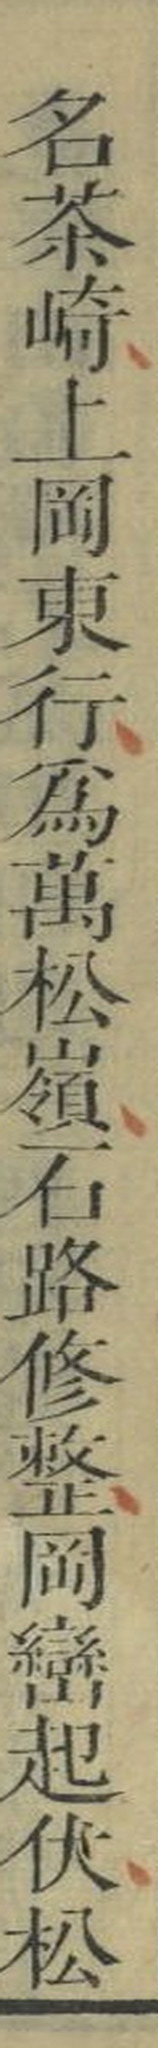名茶崎上岡東行爲萬松嶺石路修整岡巒起伏松
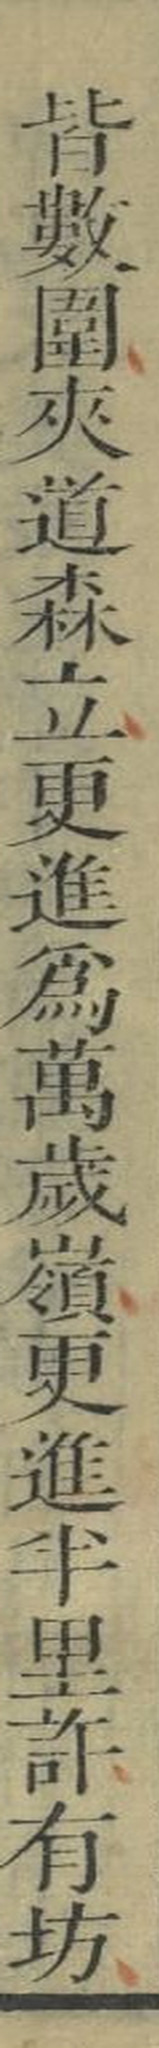皆數圍夾道森立更進爲萬歲嶺更進半里許有坊
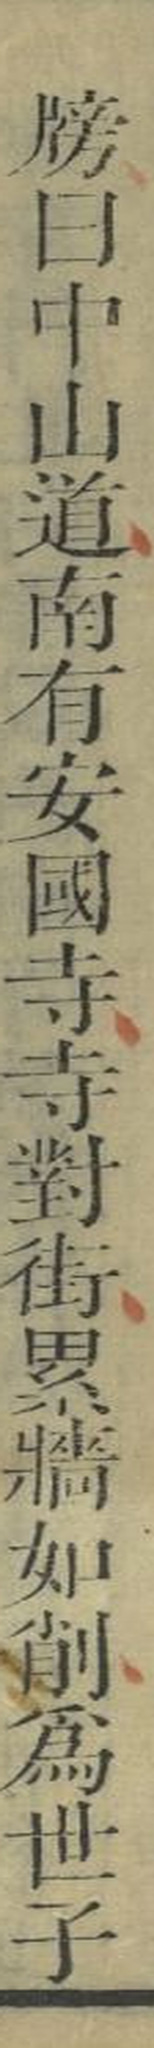牓曰中山道南有安國寺寺對街累牆如削爲世子
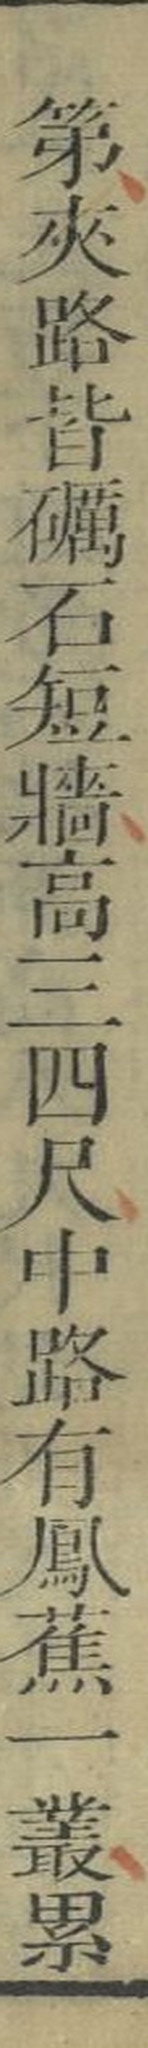第夾路皆礪石短牆高三四尺中路有鳳蕉一叢累
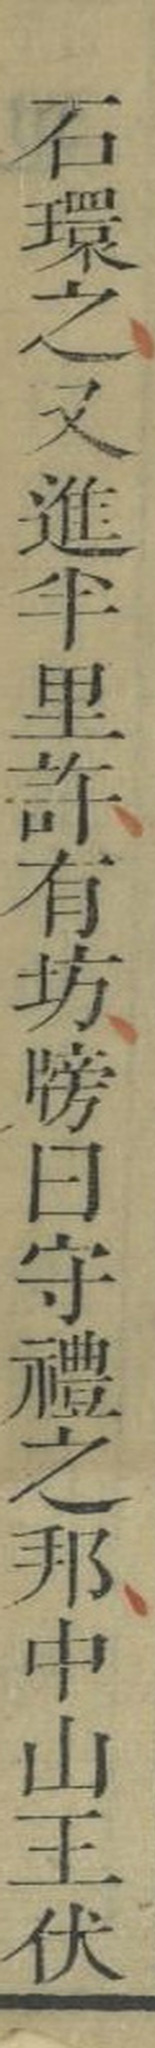石環之又進半里許有坊牓曰守禮之邦中山王伏

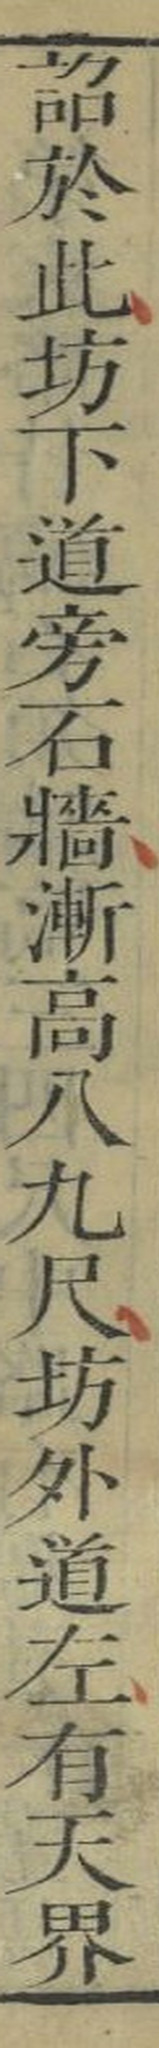詔於此坊下道旁石牆漸高八九尺坊外道左有天界
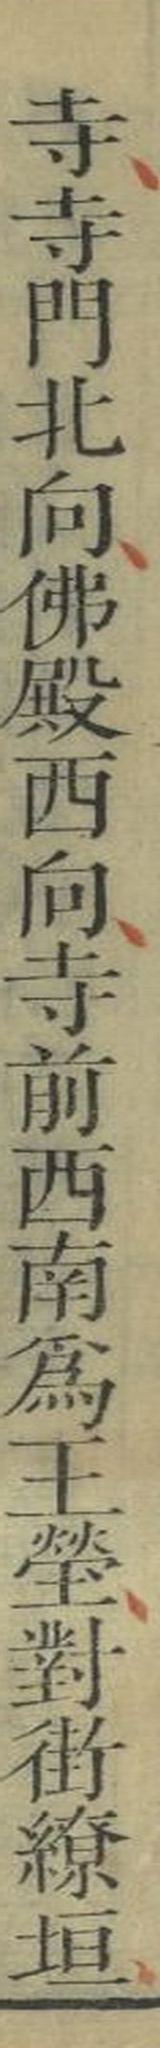寺寺門北向佛殿西向寺前西南爲王塋對街繚垣
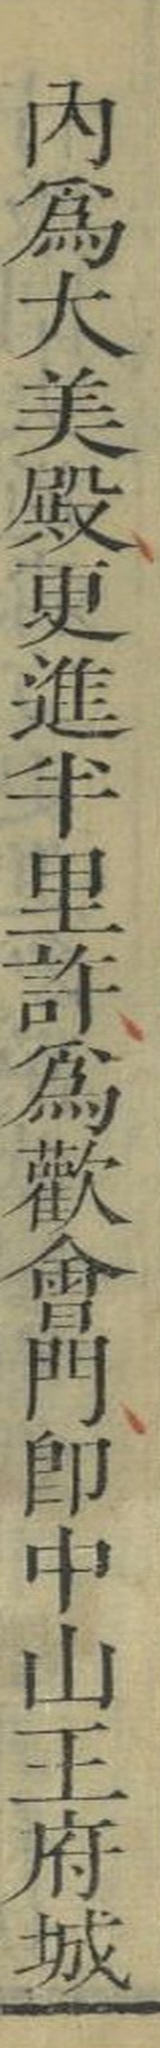内爲大美殿更進半里許爲歡會門卽中山王府城
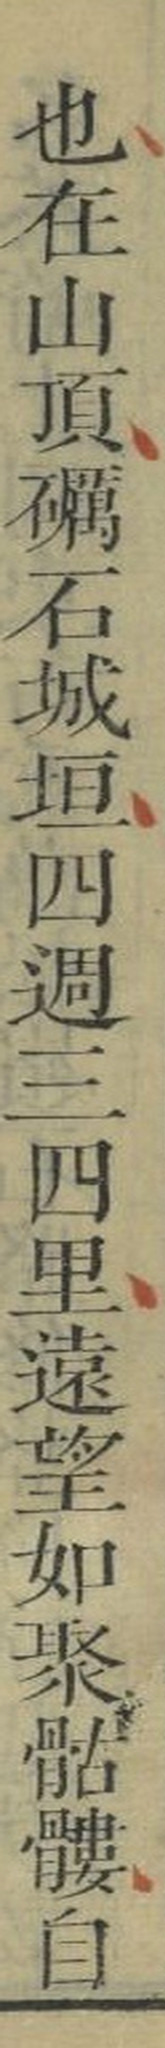也在山頂礪石城垣四週三四里遠望如聚骷髏自
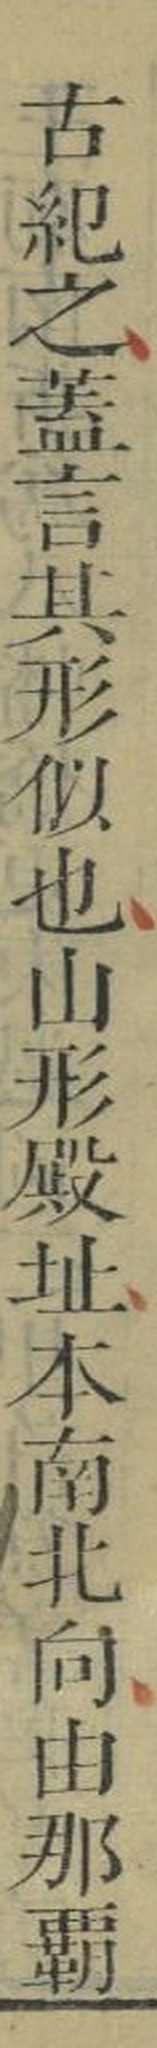古紀之蓋言其形似也山形殿址本南北向由那覇
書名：中山伝信録 巻一、巻二
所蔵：University of the Ryukyus Library
